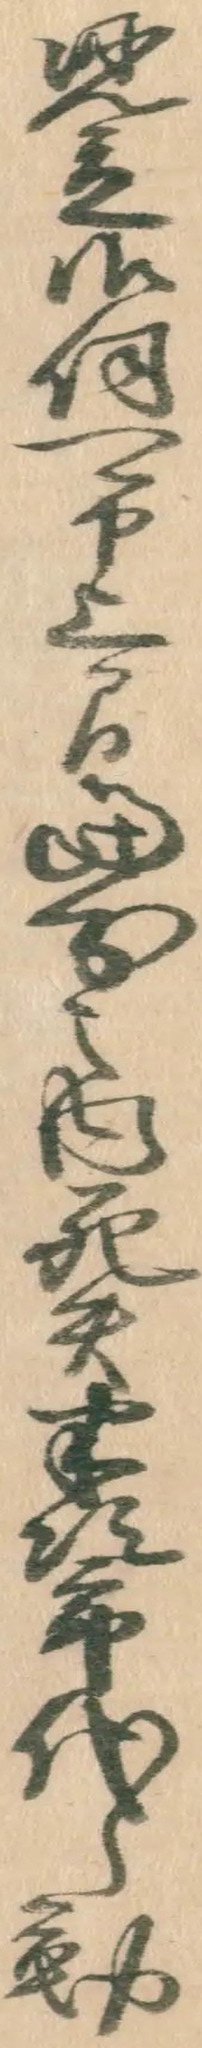見立御伺可申上間当分之内死失半次郎代り勤
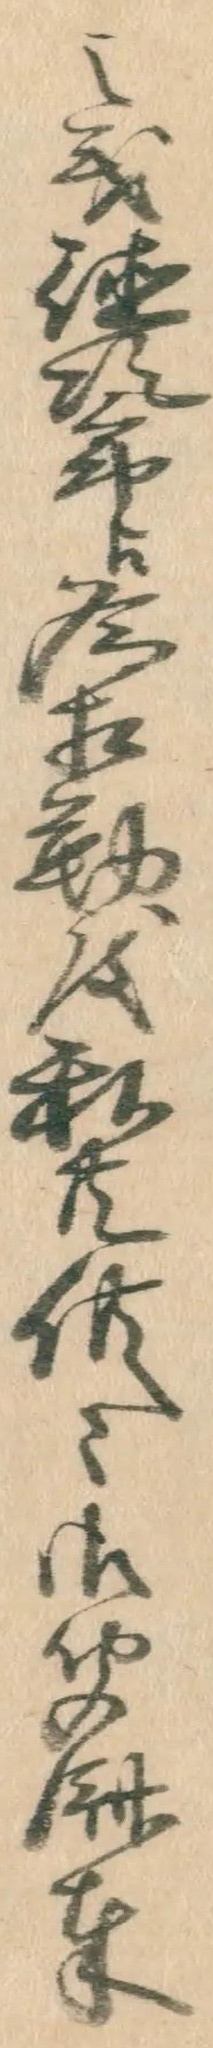之義徳次郎え為相勤度私共供々御聞済奉
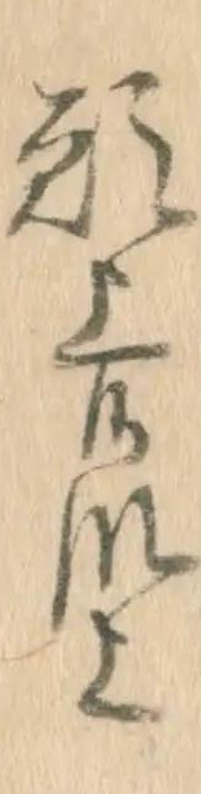願上候以上
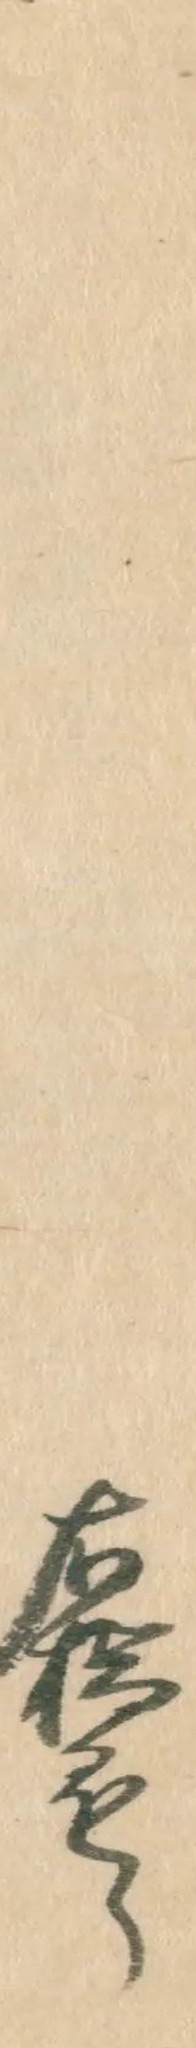右橋懸り
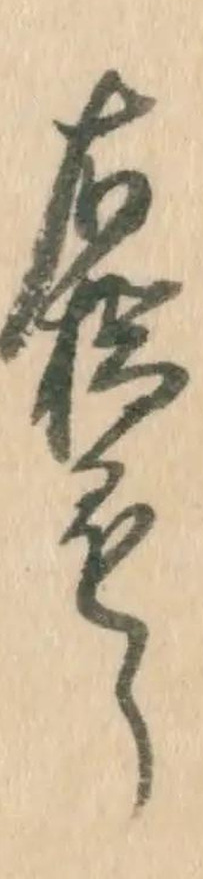右橋懸り
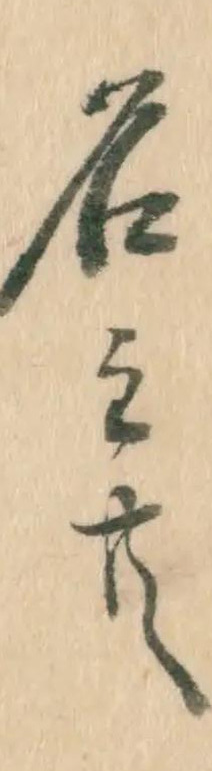名主共

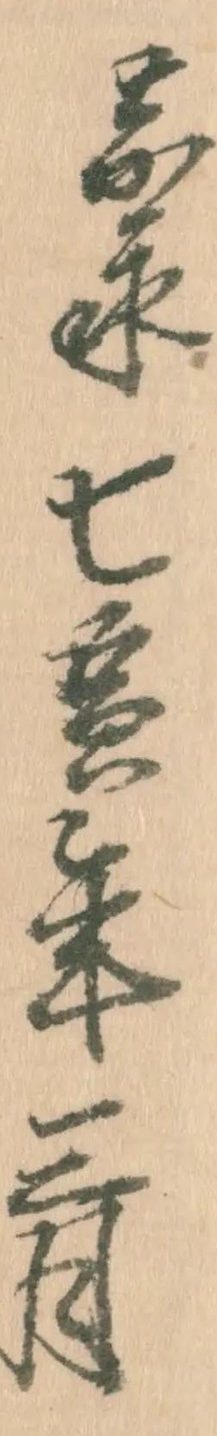嘉永七寅年三月
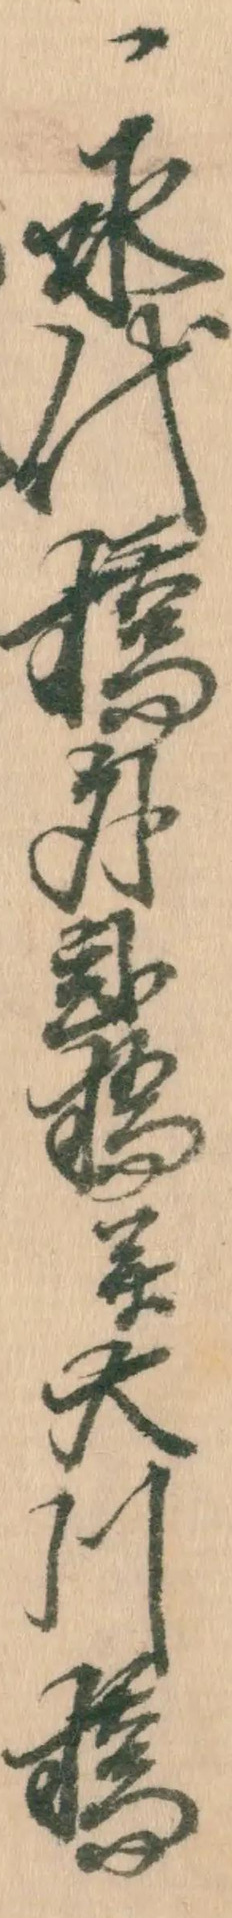永代橋外弐橋并大川橋
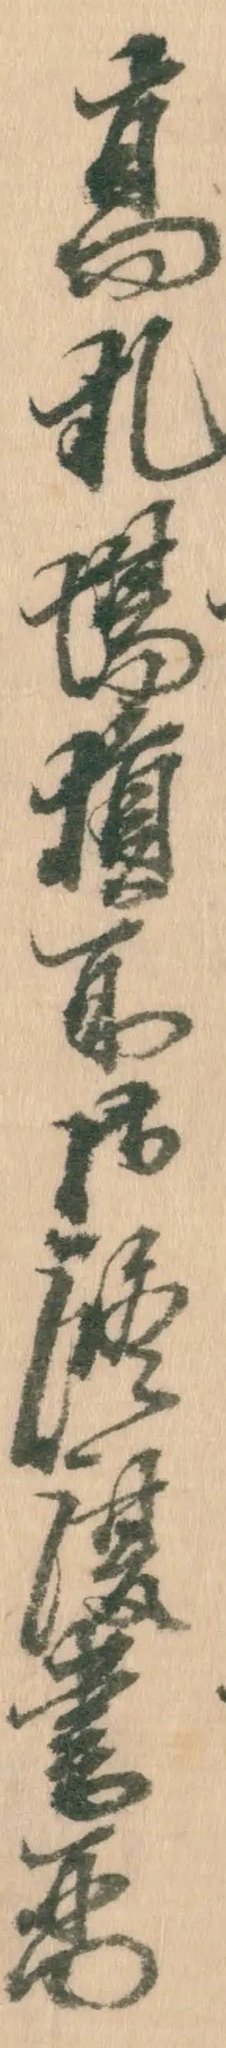高札場損所御修復書留
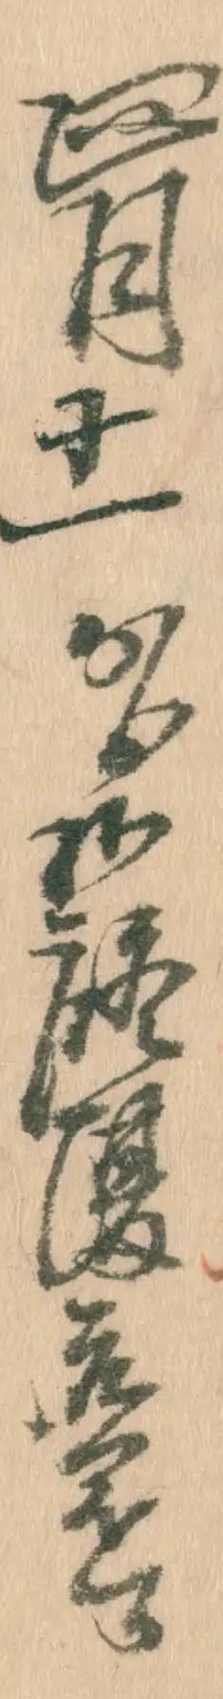四月十一日ゟ御修復取懸候

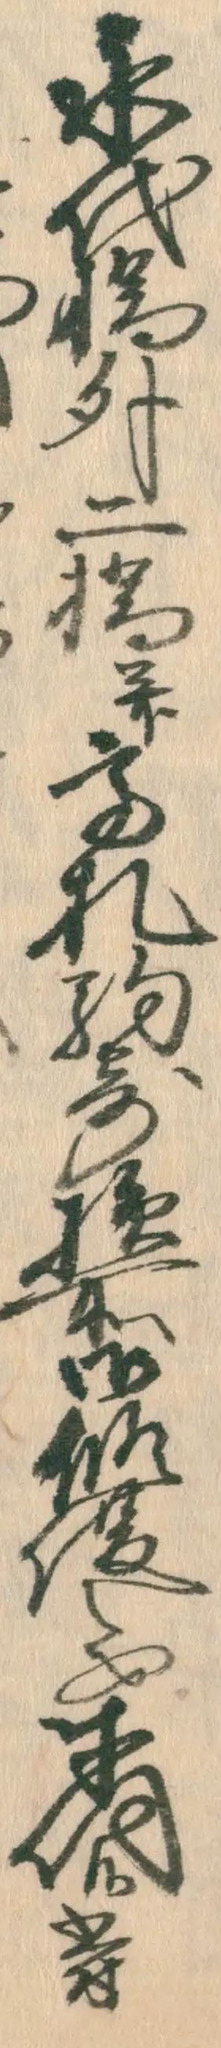永代橋外二橋并高札駒寄損所御修復之義奉伺候書付
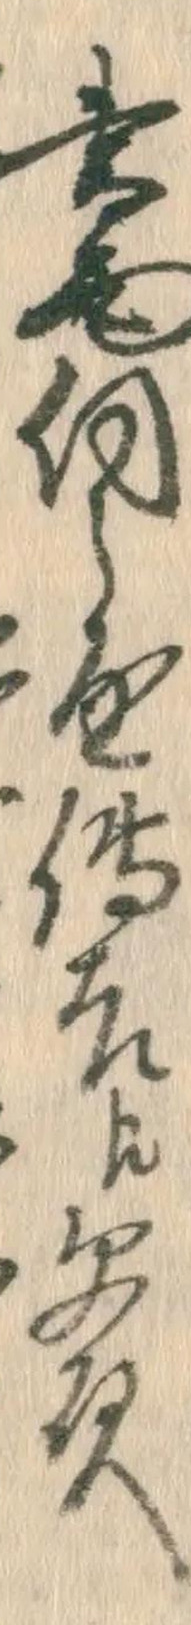書面伺之通伝吉え受負
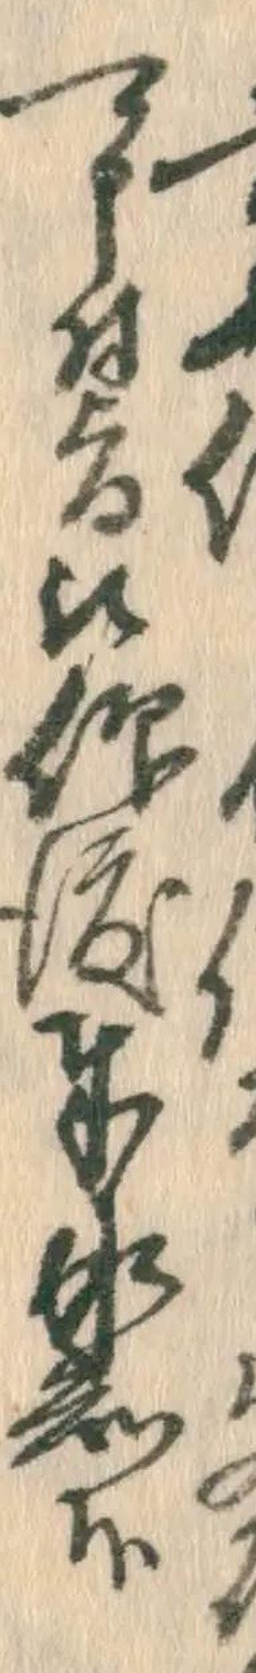可申付旨被仰渡奉承知候
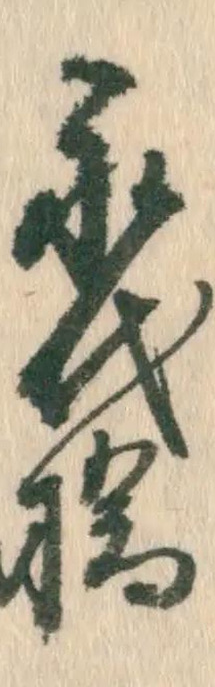永代橋
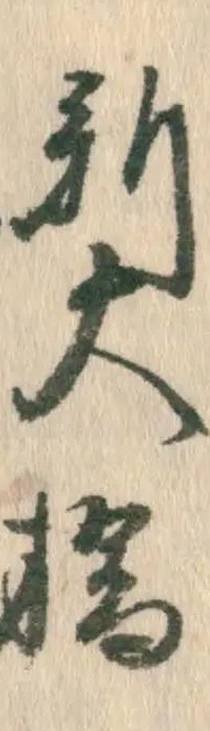新大橋
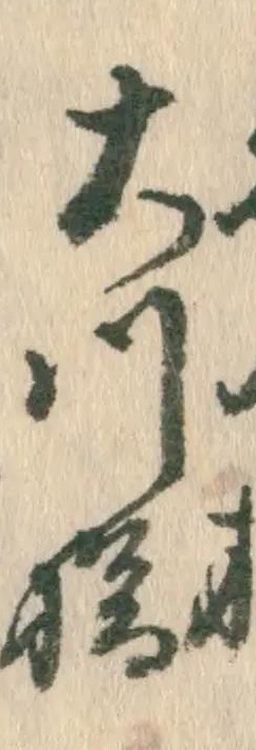大川橋
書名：三橋 17巻. [8] 三橋小破御修復書留　但御奉行御掛リ替地震潰橋番屋　嘉永四亥年より安政二卯年迄　下
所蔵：国立国会図書館 National Diet Library, JAPAN
